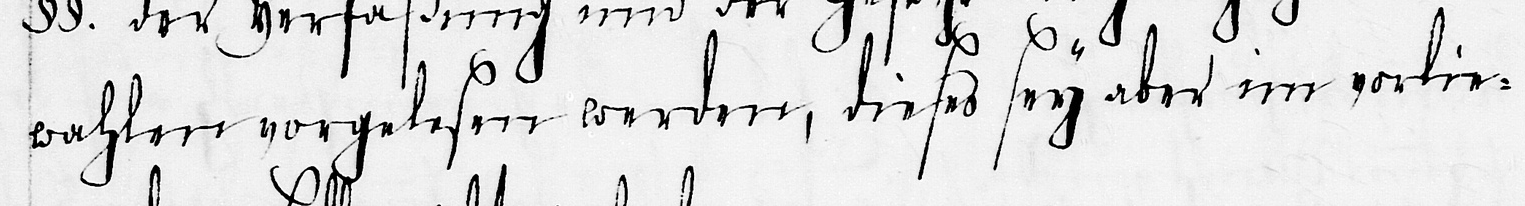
wahlen vorgelesen werden, dieses sey aber im vorlie¬
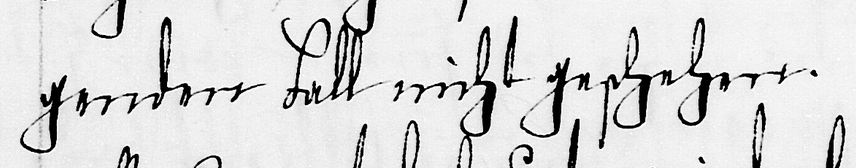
genden Fall nicht geschehen.
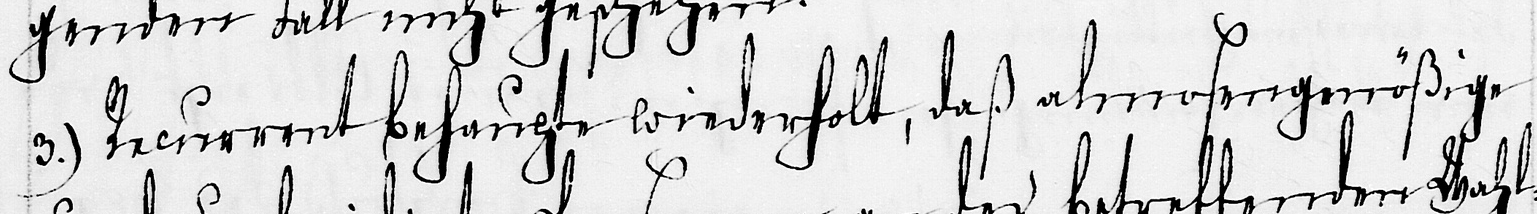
3.) Recurrent behaupte wiederholt, daß almosengenößige
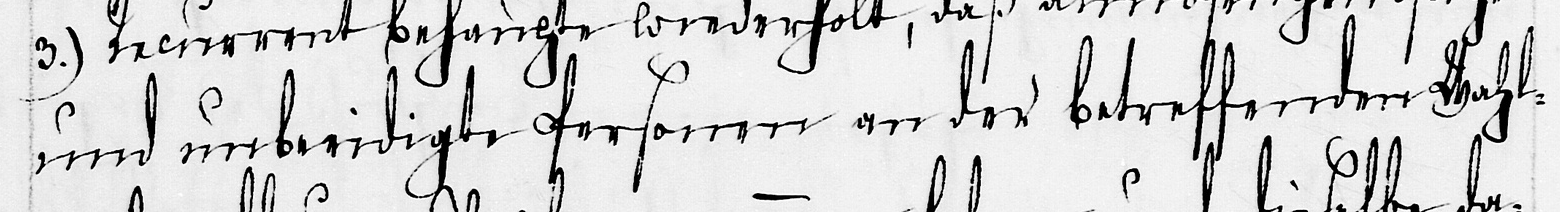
und unbeeidigte Personen an der betreffenden Wahl¬
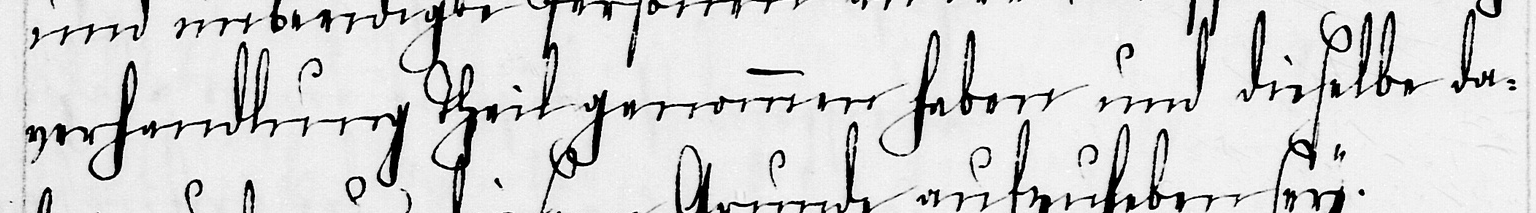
verhandlung Theil genommen haben und dieselbe da¬
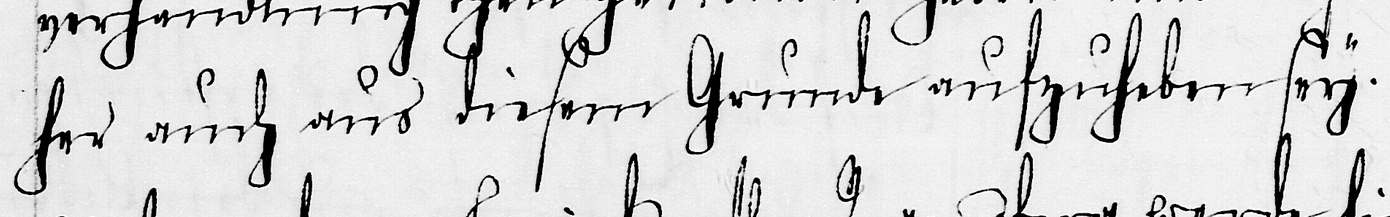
her auch aus diesem Grunde aufzuheben sey.
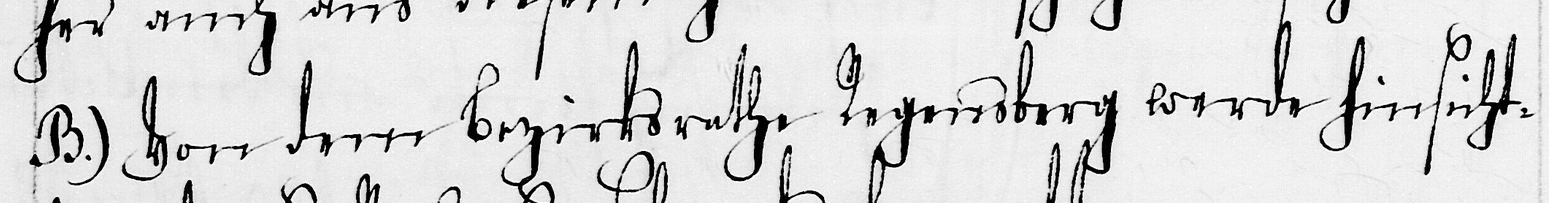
B.) Von dem Bezirksrathe Regensberg werde hinsich¬
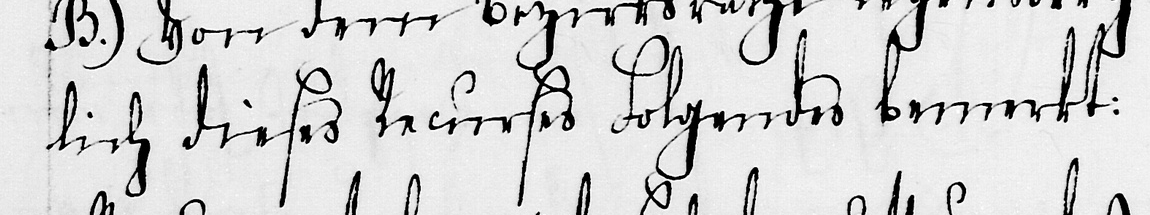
tlich dieses Recurses Folgendes bemerkt:
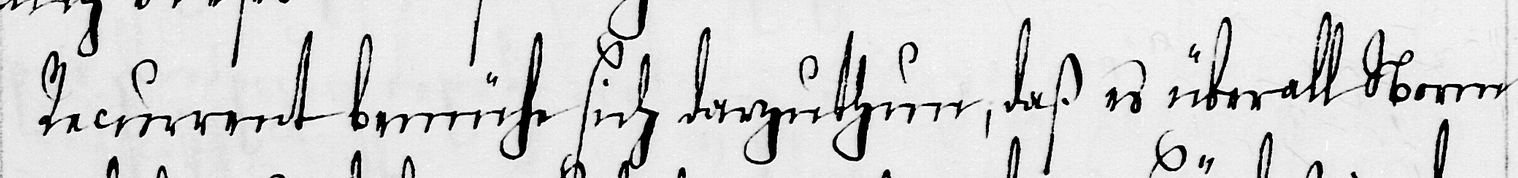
Recurrent bemühe sich darzuthun, daß es überall Norm
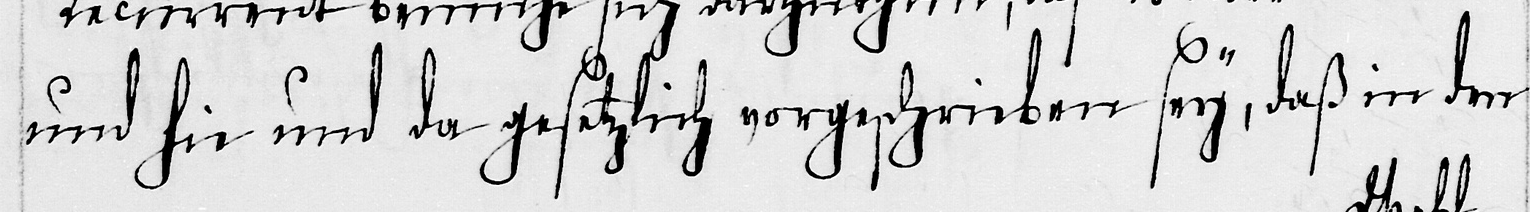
und hie und da gesetzlich vorgeschrieben sey, daß in den
